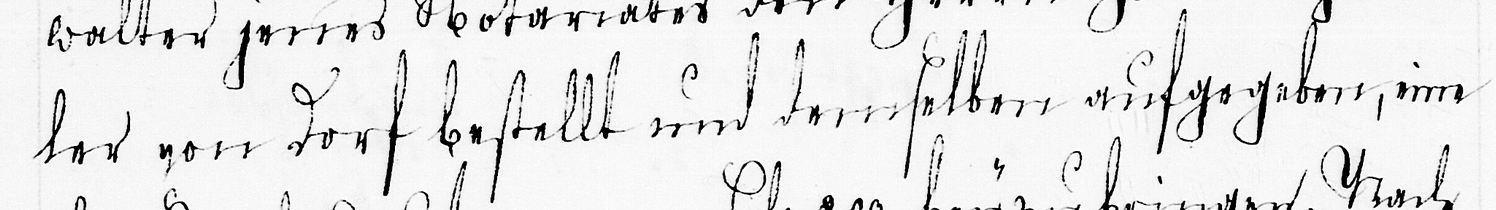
ler von Dorf bestellt und demselben aufgegeben, eine
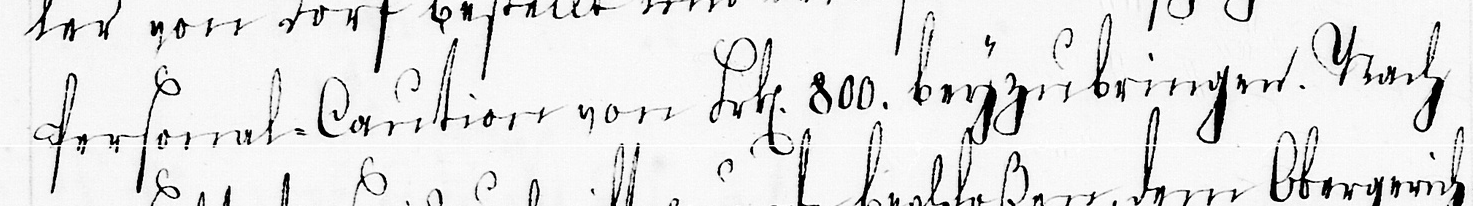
Personal-Caution von Frk[en]. 800. beyzubringen. Nach
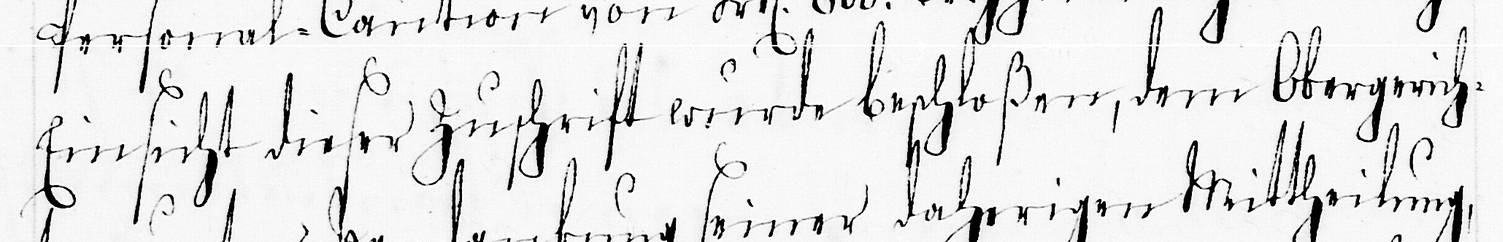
Einsicht dieser Zuschrift wurde beschloßen, dem Obergeric¬
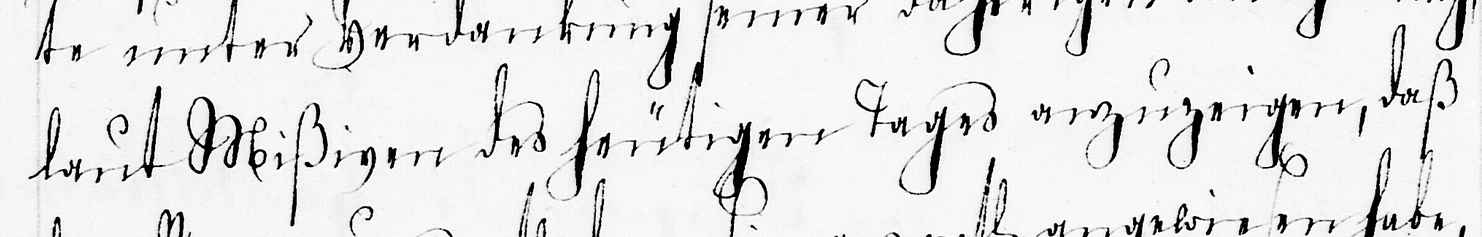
laut Mißiven des heutigen Tages anzuzeigen, daß
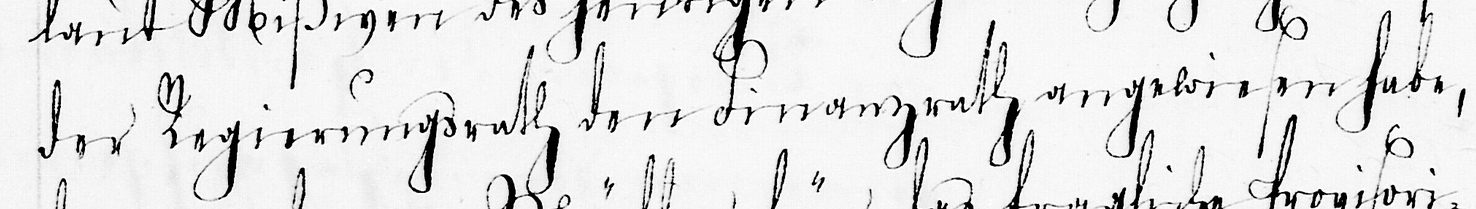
der Regierungsrath den Finanzrath angewiesen habe,
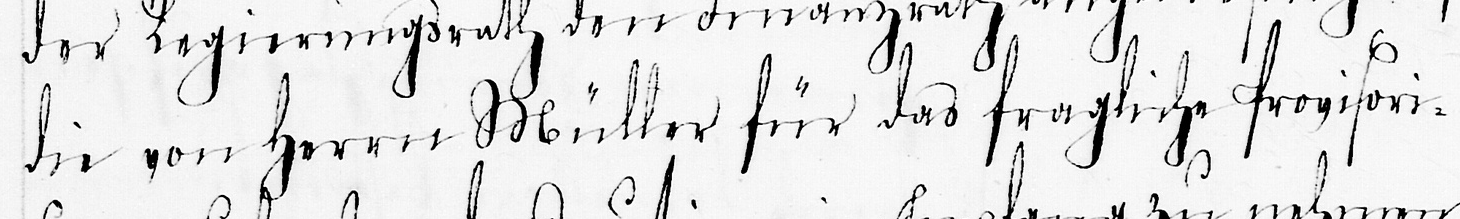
die von Herrn Müller für das fragliche Provisori¬
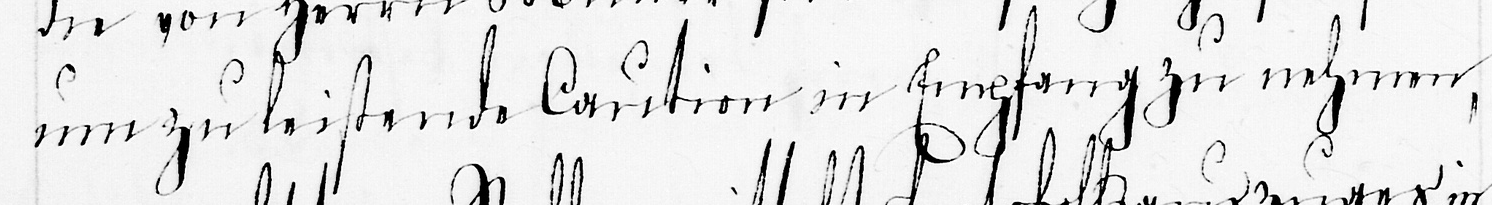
um zu leistende Caution in Empfang zu nehmen,
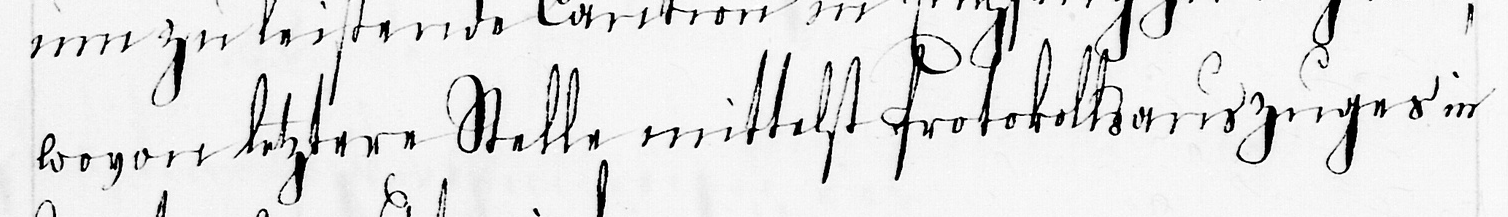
wovon letztere Stelle mittelst Protokollsauszuges in
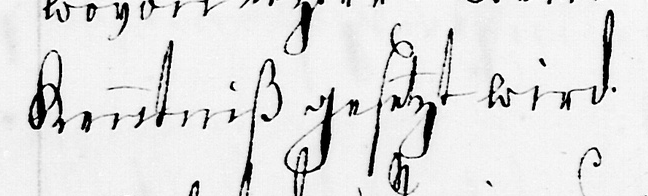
Kenntniß gesetzt wird.
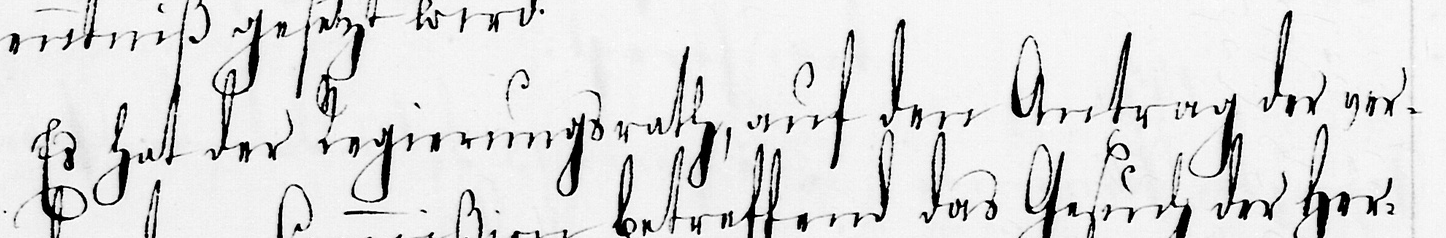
Es hat der Regierungsrath, auf den Antrag der ver¬
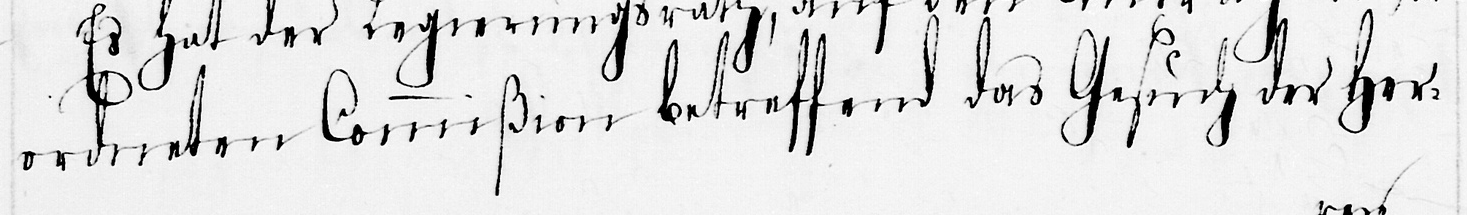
ordneten Commißion betreffend das Gesuch der Her-
